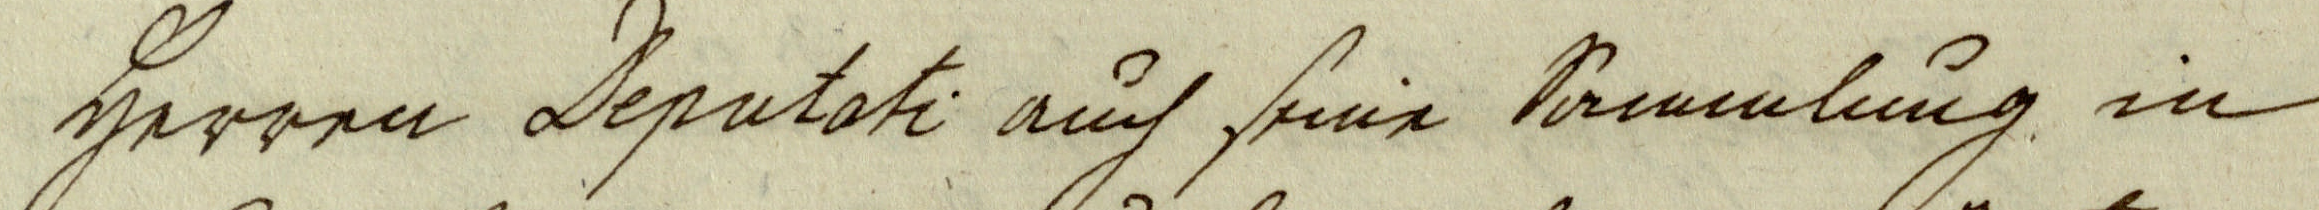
Herren Deputati auch seine Sammlung in
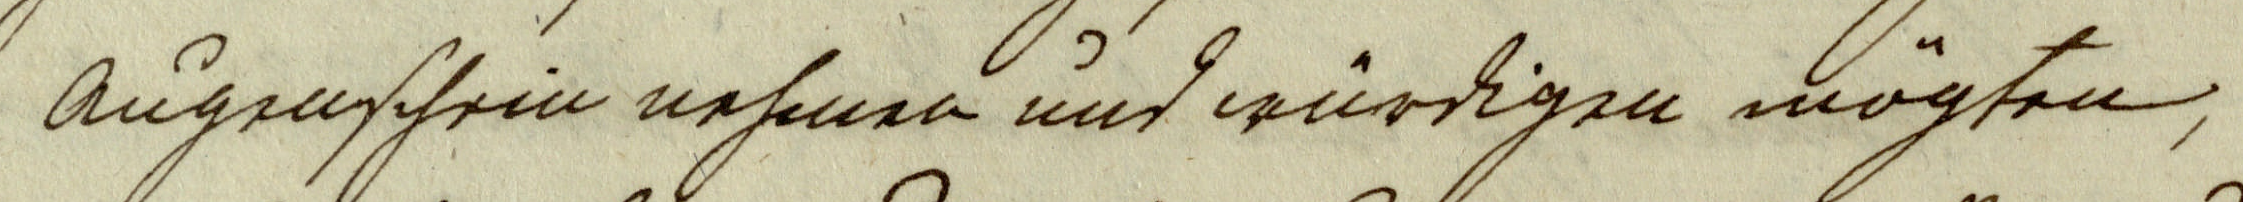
Augenschein nehmen und würdigen mögten,
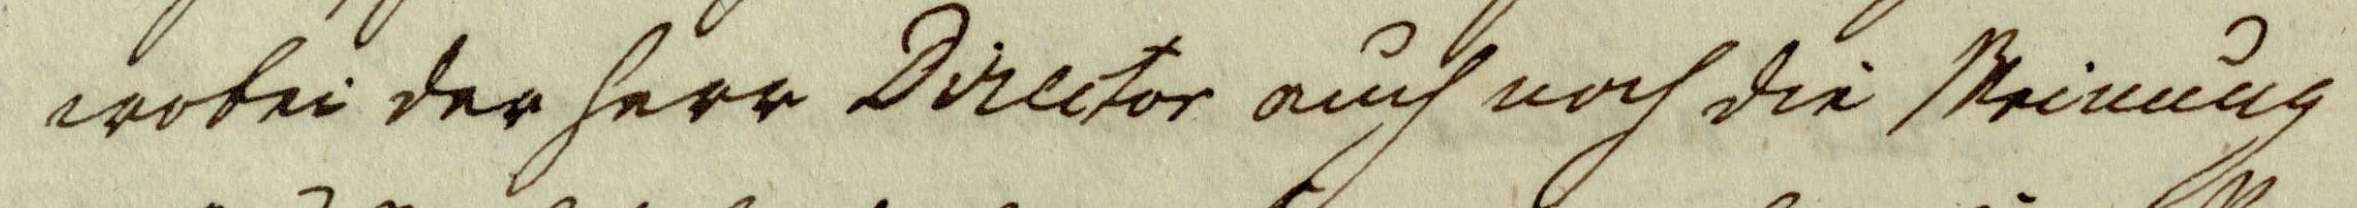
wobei der Herr Director auch noch die Meinung
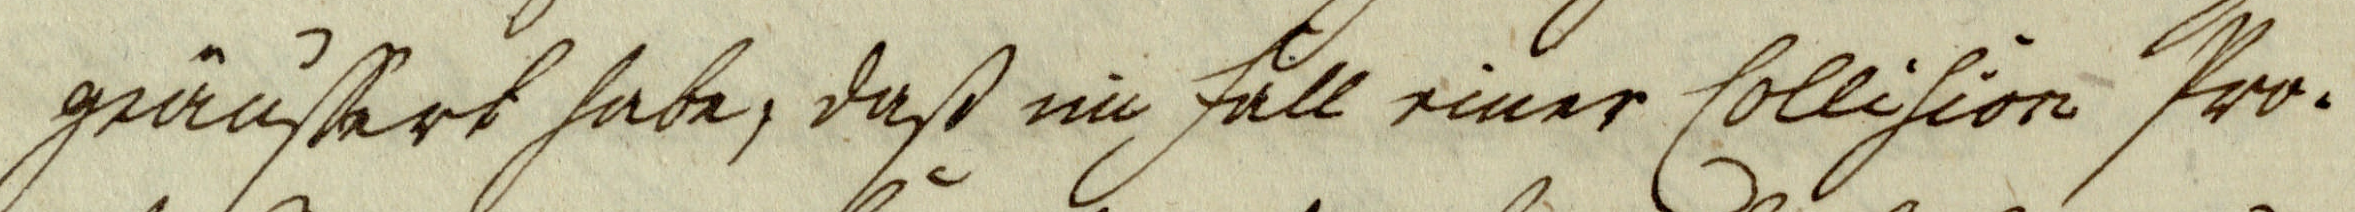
geäussert habe, daß im Fall einer Collision Pro¬
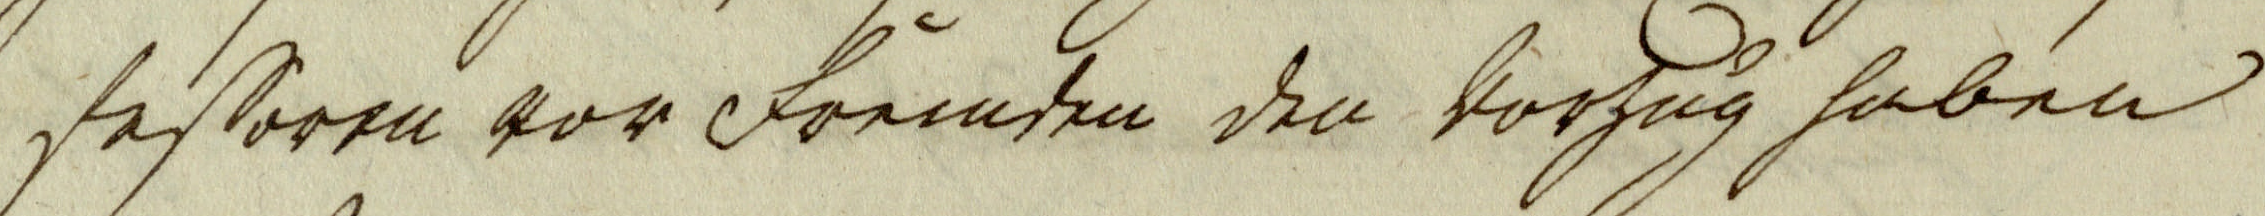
fessoren vor Fremden den Vorzug haben
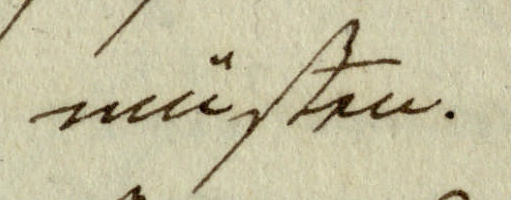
müssten.
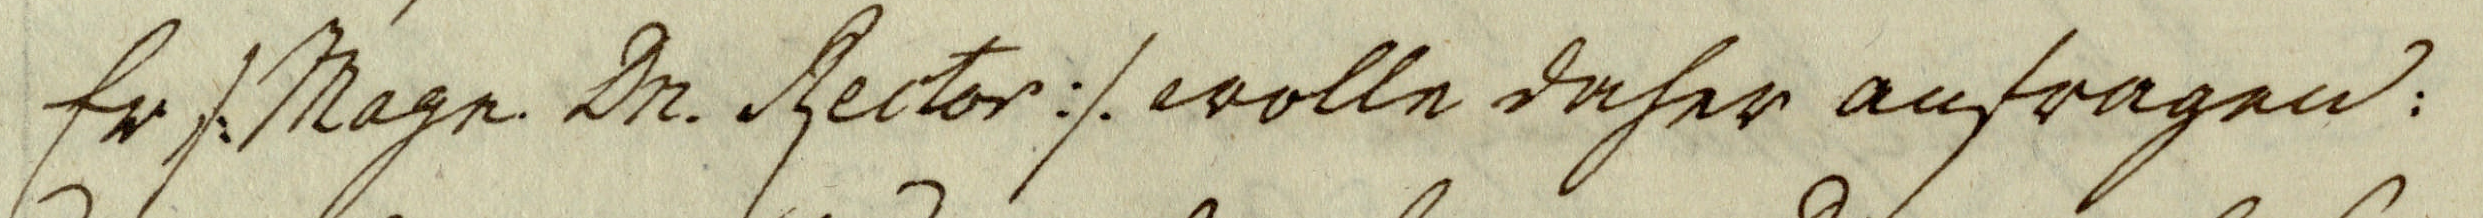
Er /: Magn. Dn. Rector :/ wolle daher anfragen:
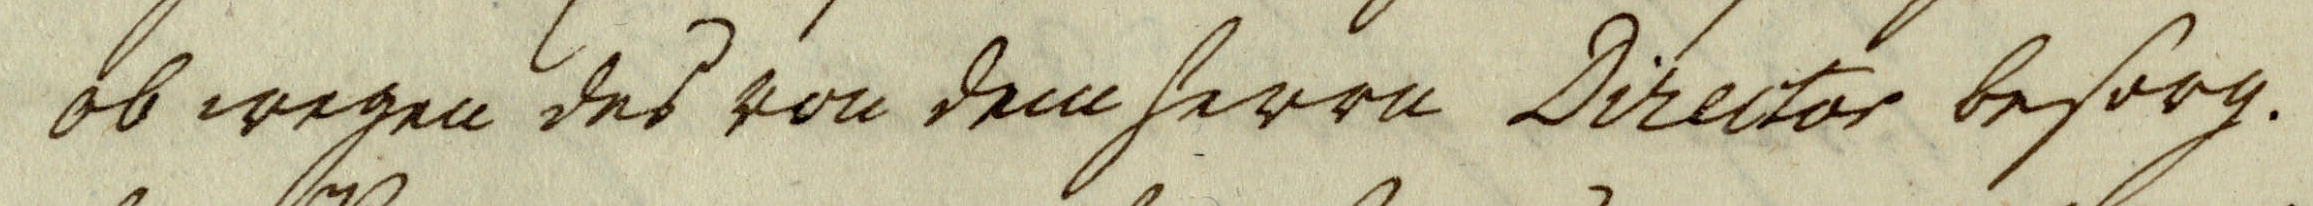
ob wegen des von dem Herrn Director besorg¬
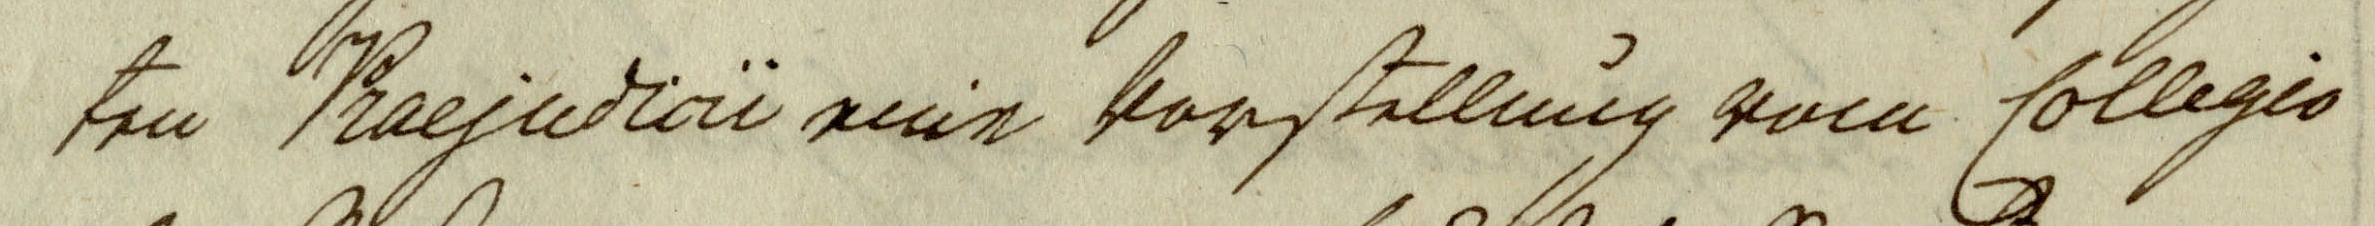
ten Praejudicii eine Vorstellung vom Collegio
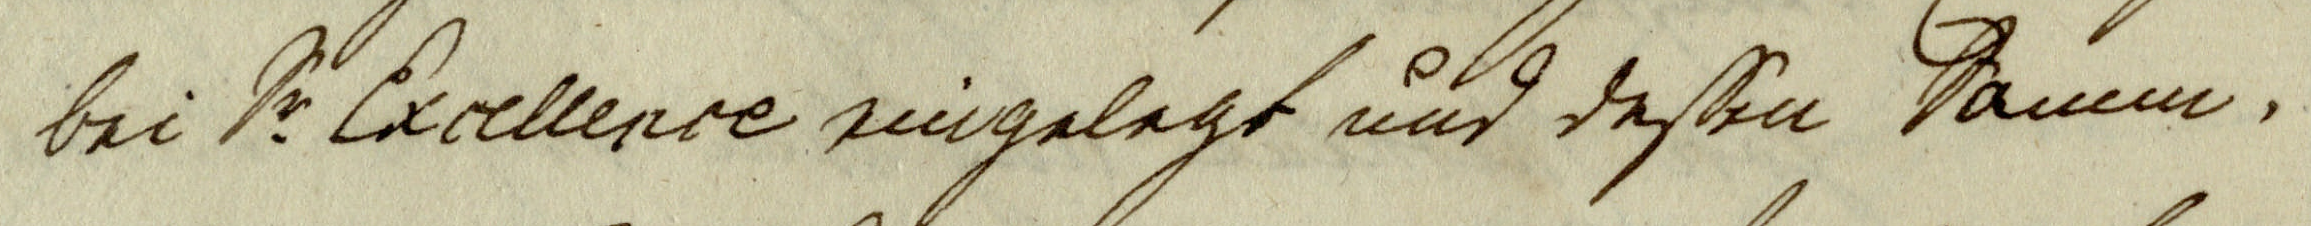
bei Sr. Excellence eingelegt und dessen Samm¬
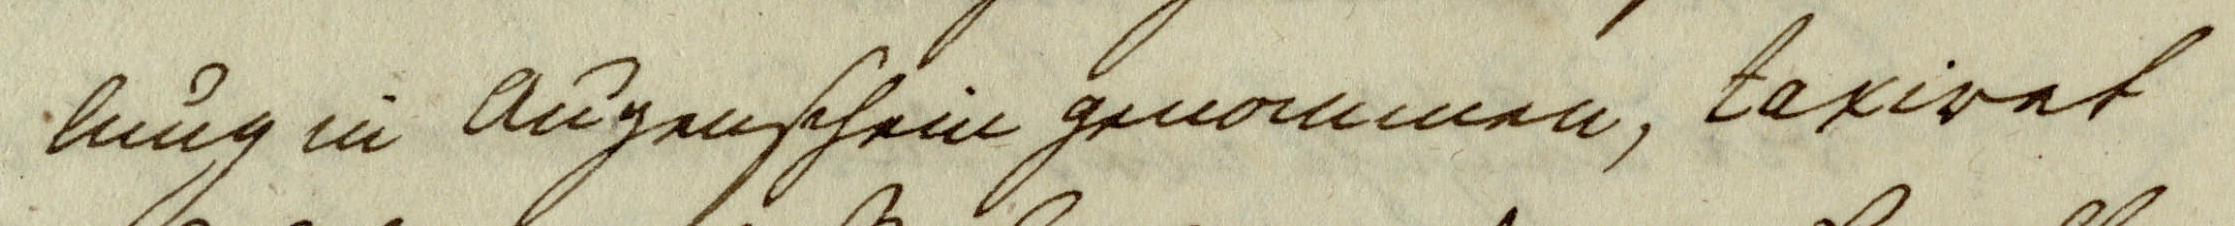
lung in Augenschein genommen, taxiret
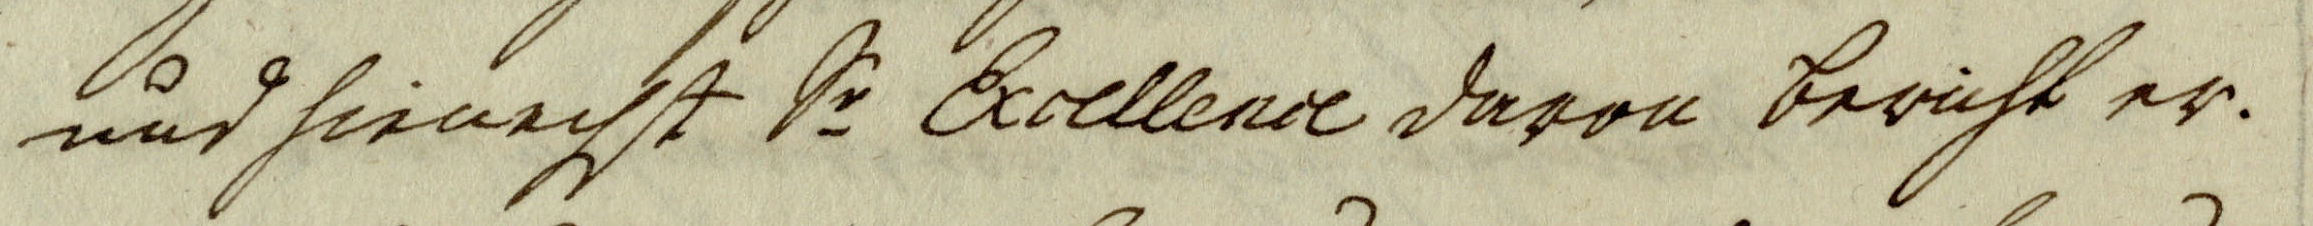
und hienechst Sr. Excellence davon Bericht er¬
